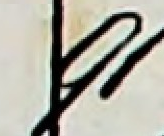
91
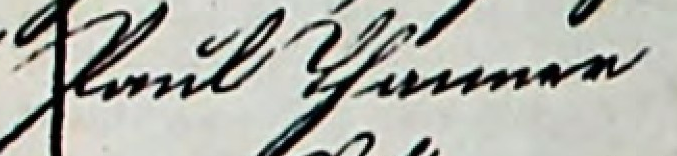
Paul Thanner
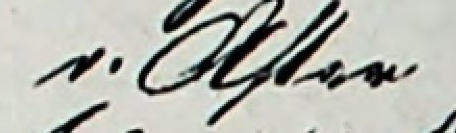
v. Aster
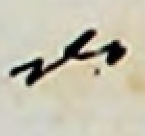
do
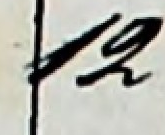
12
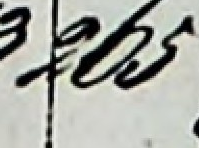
265
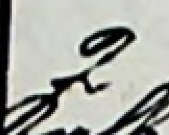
2
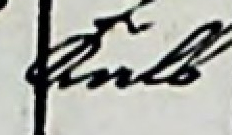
Kalb
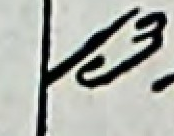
13
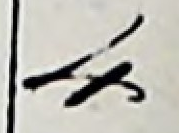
4
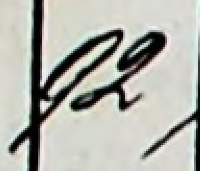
92
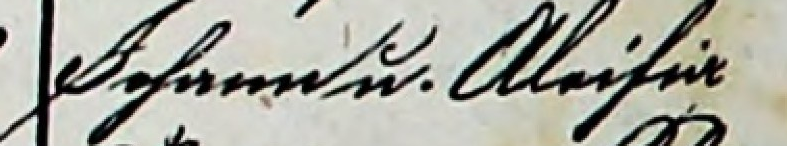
Johann u. Aloisia
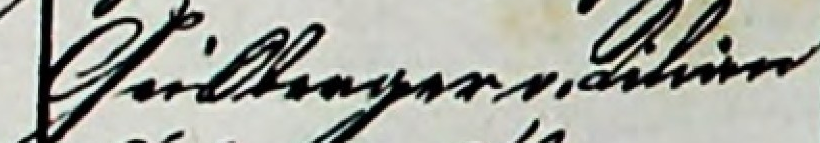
Geisberger v. Kilian
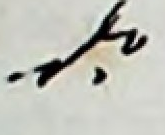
do
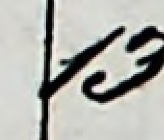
13
